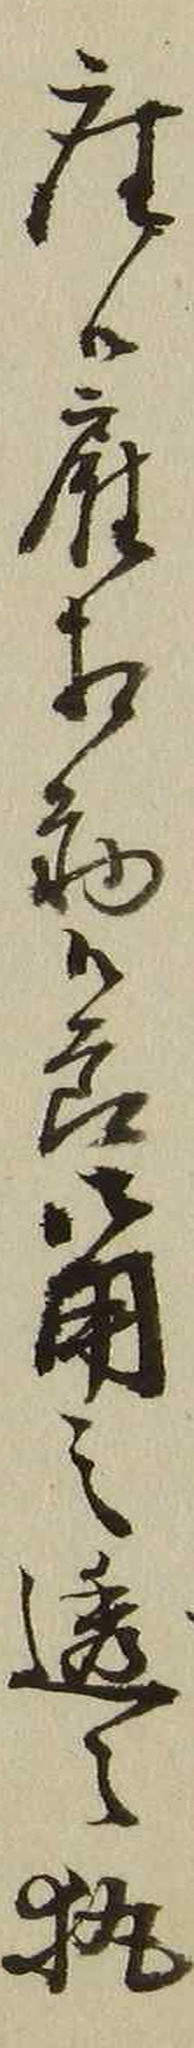座御雇相勤候節御用之透之執
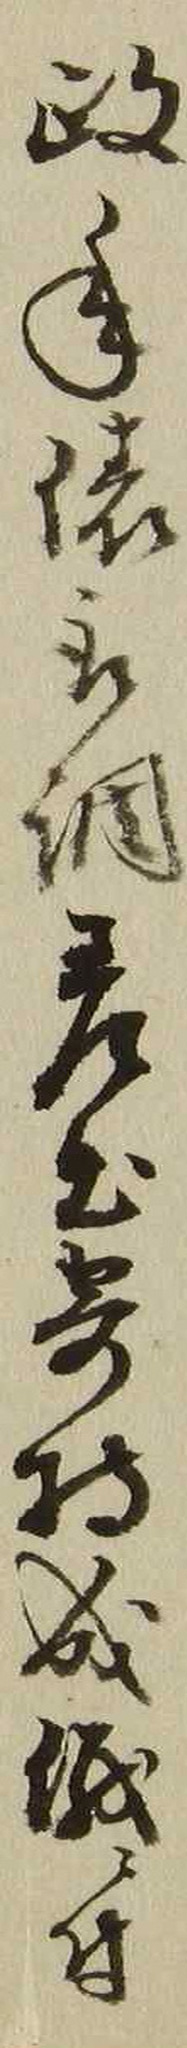政年俵取調差出寄特成儀ニ付
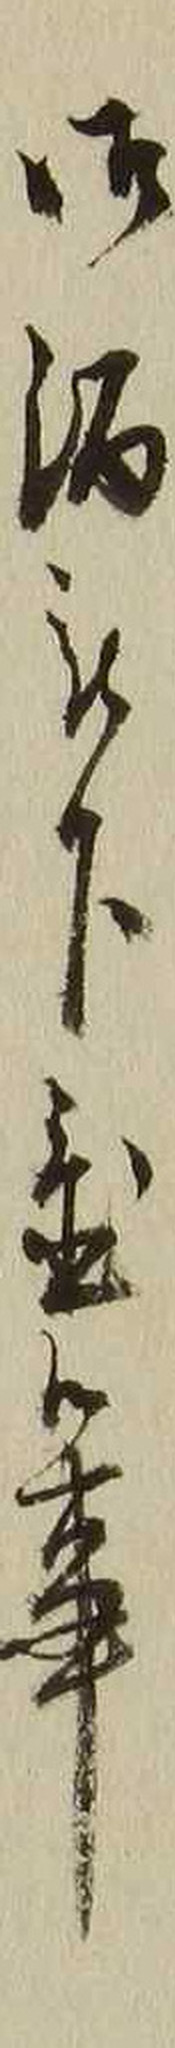御酒取下候事
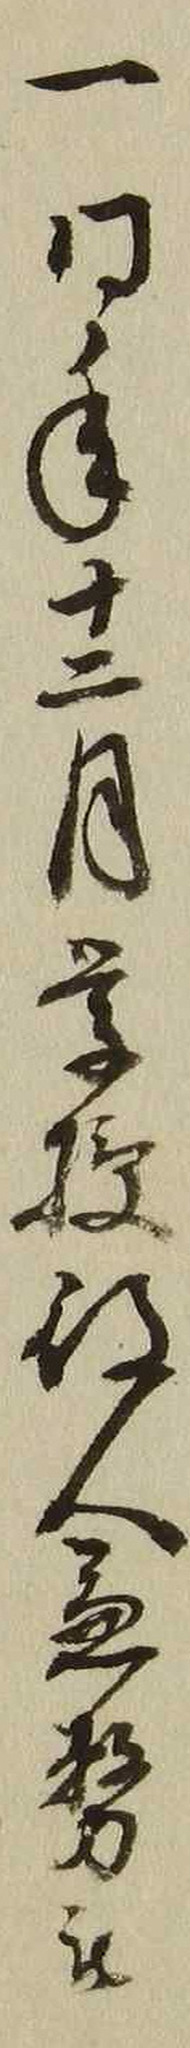一同年十二月学校役人兼務被
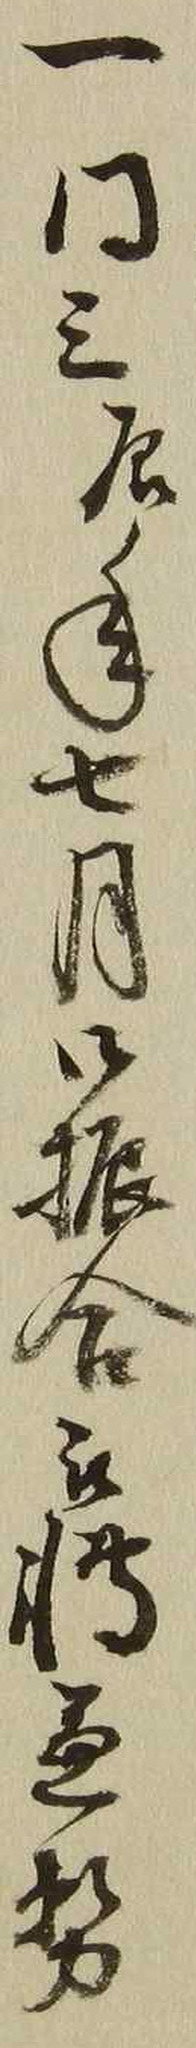一同三辰年七月御振合被転兼務
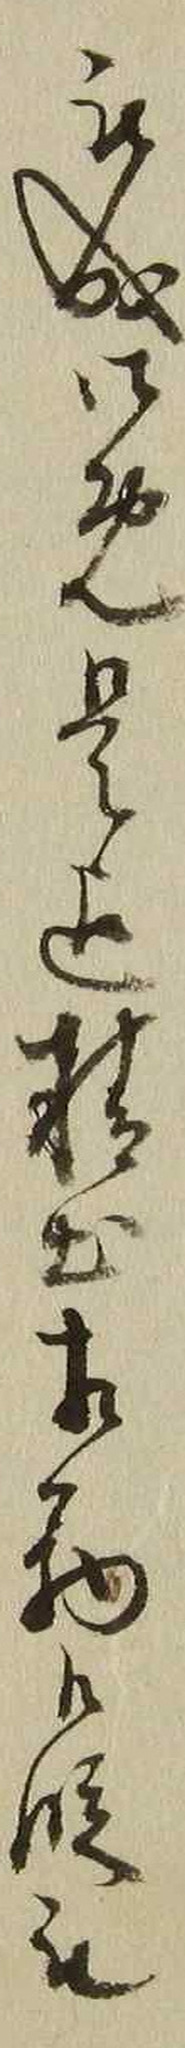被成御免是迄精出相勤候段被
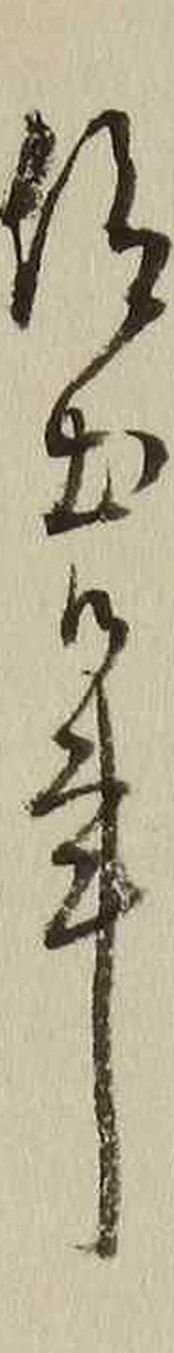仰出候事
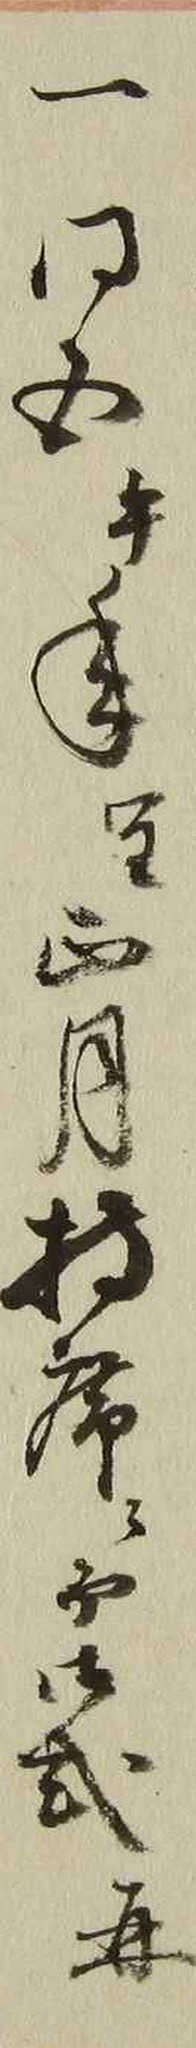一同五午年閏正月持席ニ而御式并
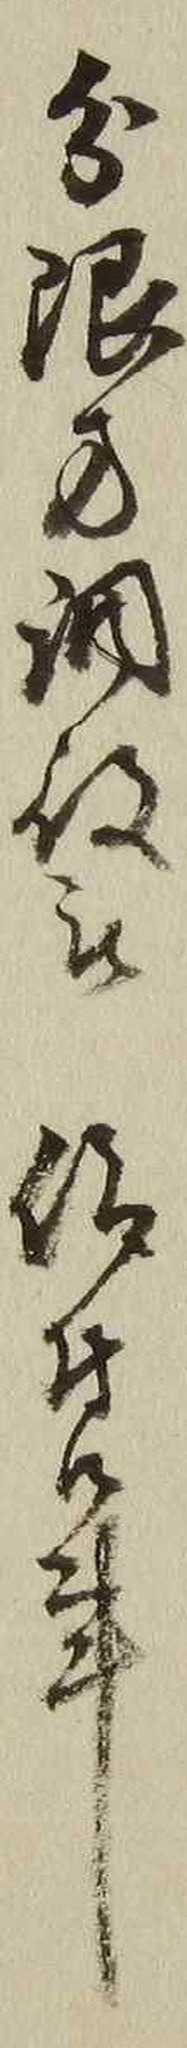分限方調役被仰付候事
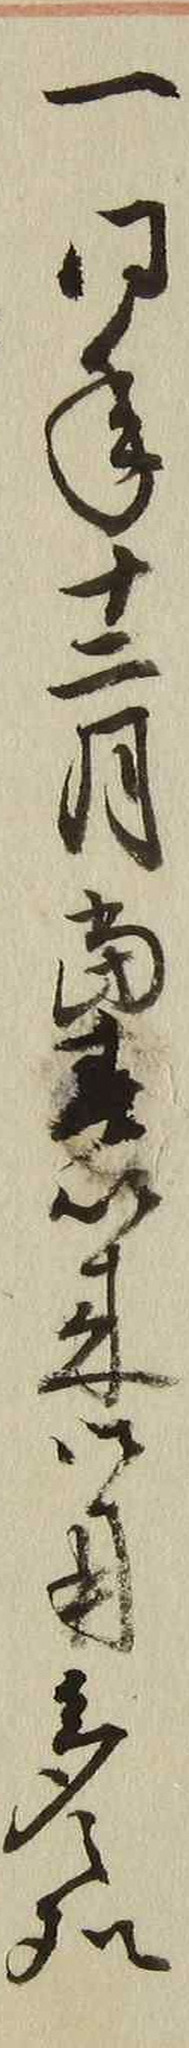一同年十二月当春以来御用多之処
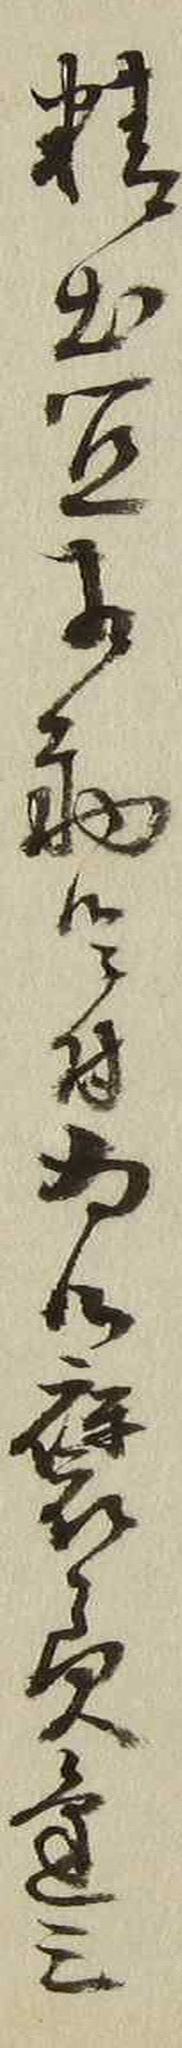精出宜相勤候ニ付為御褒美金三
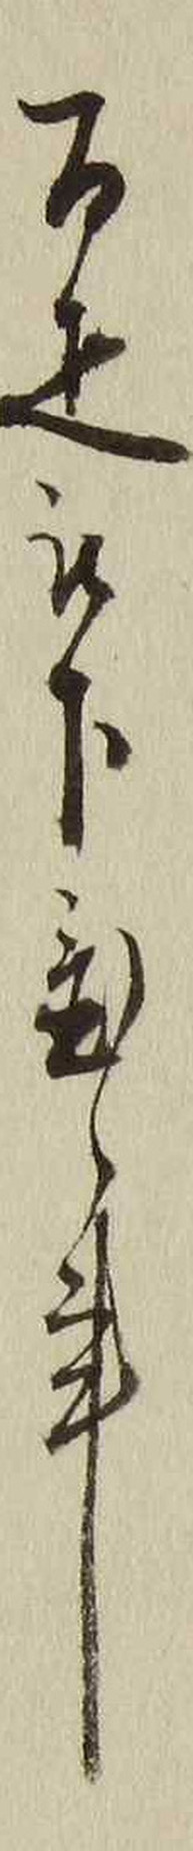百疋被下置候事
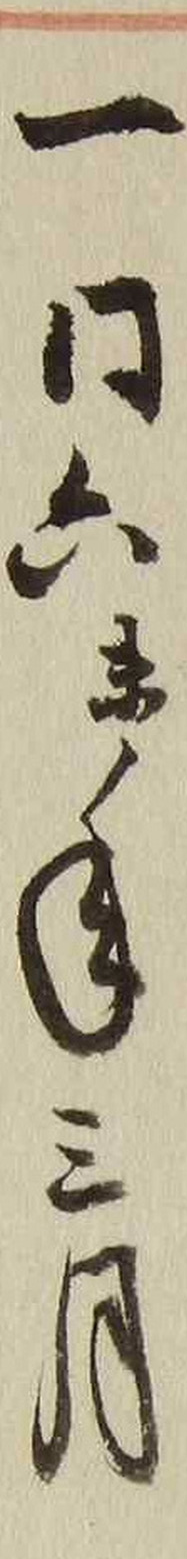一同六未年三月
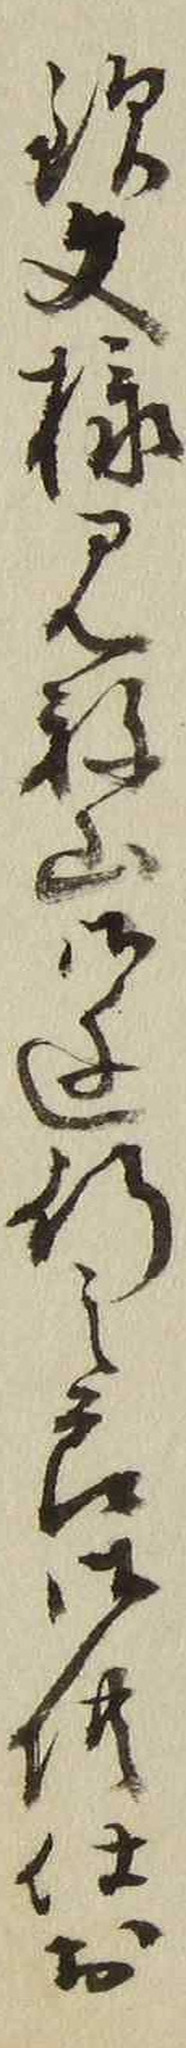欽文様見禰山御遷行之節御供仕於
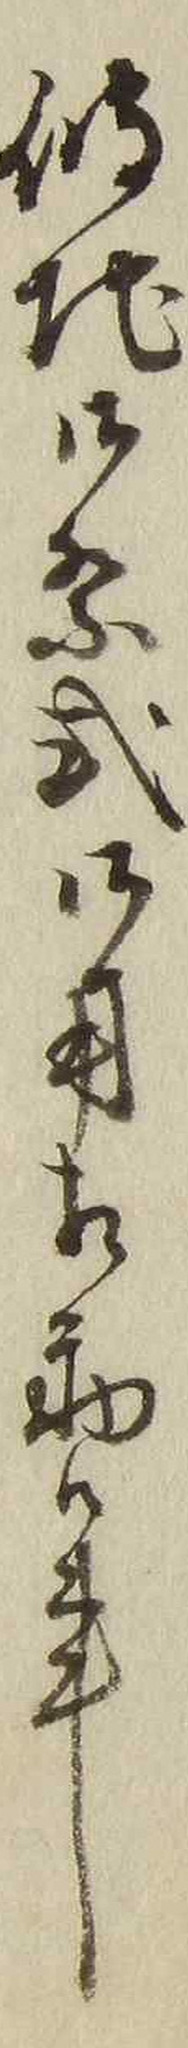彼地御祭式御用相勤候事
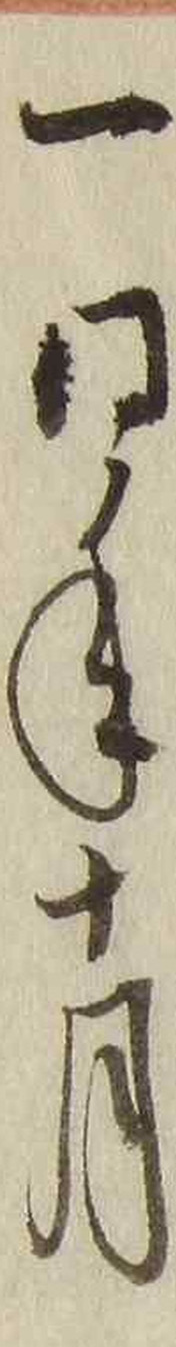一同年十月
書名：諸士系譜　巻之39　は之部7
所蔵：会津若松市立会津図書館
